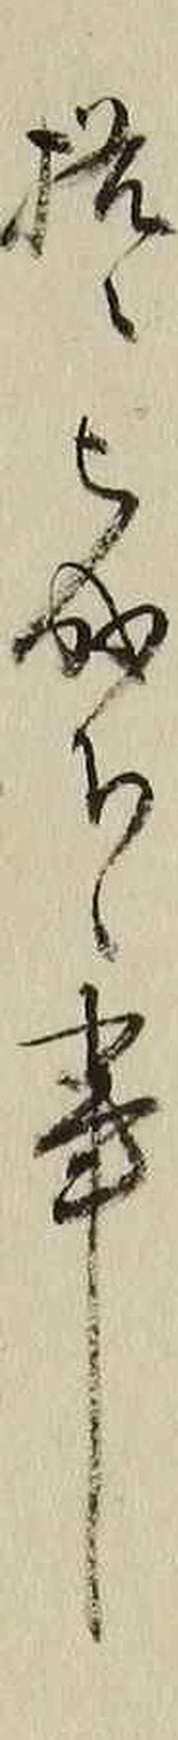格ニ被成下候事
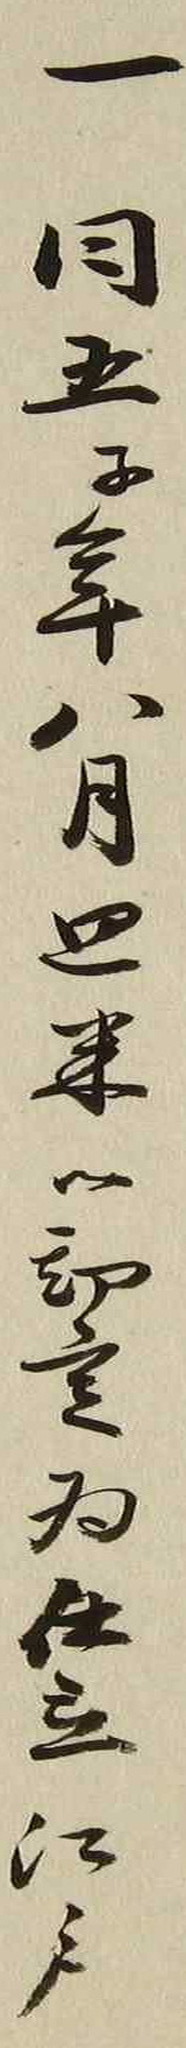一同五子年八月廻米御勘定為仕立江戸
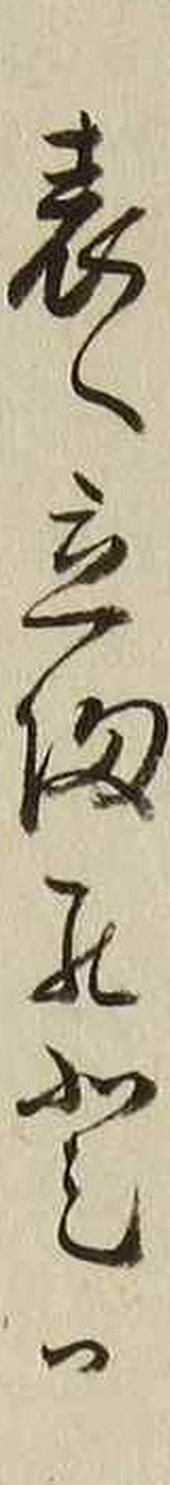表へ立帰罷登候
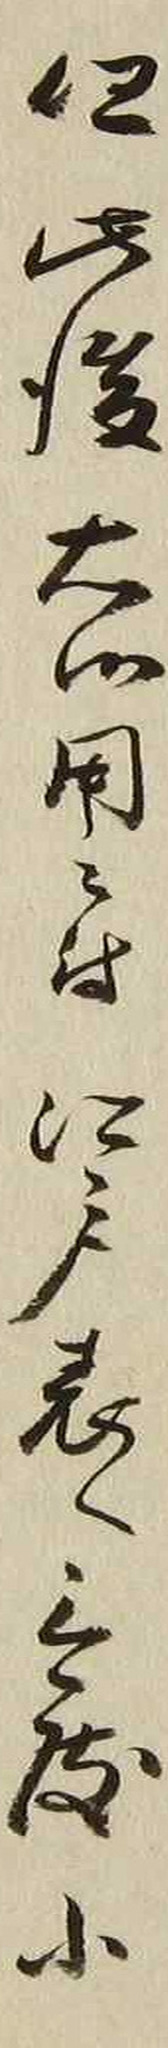但此後右御用ニ付江戸表へ三度小
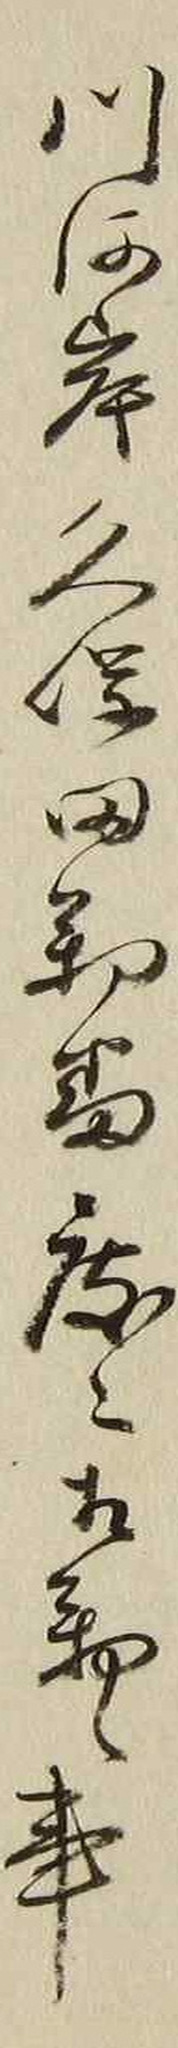川河岸久保田勤番度々相勤候事
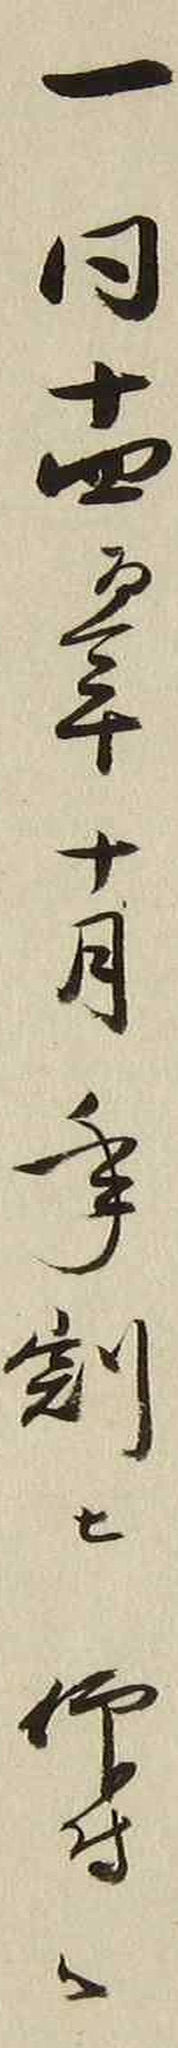一同十四酉年十月年割被仰付候
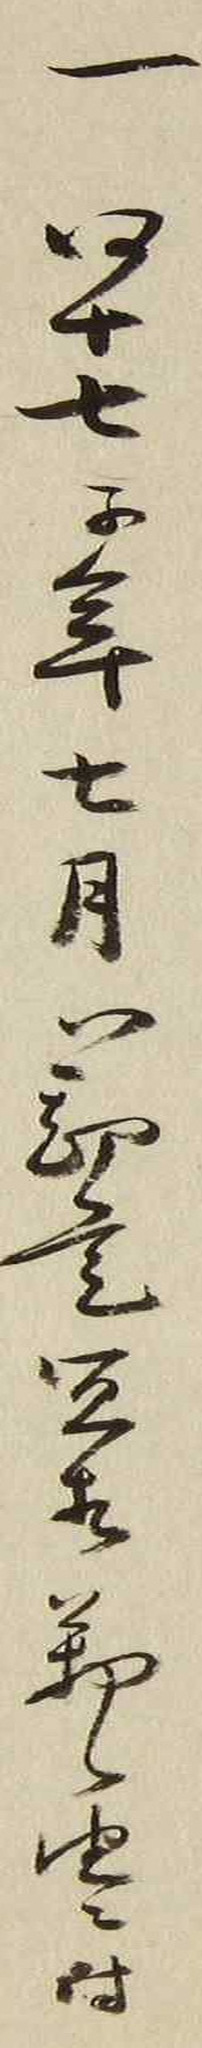一同十七子年七月御勘定宜相勤候由ニ付
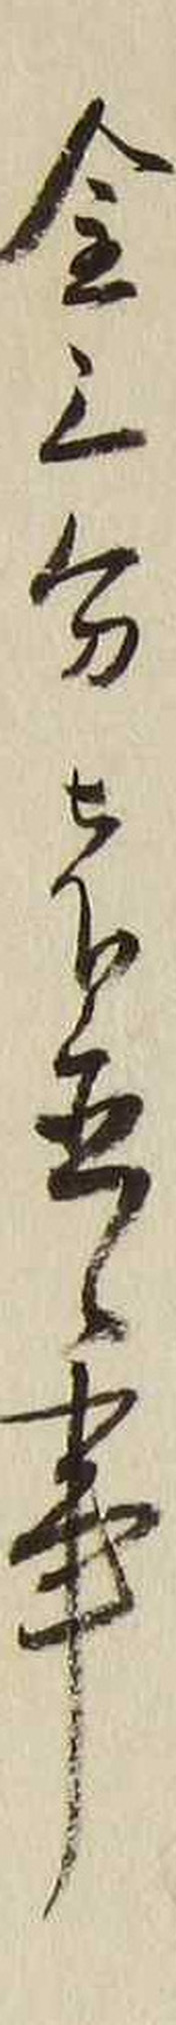金三分被下置候事
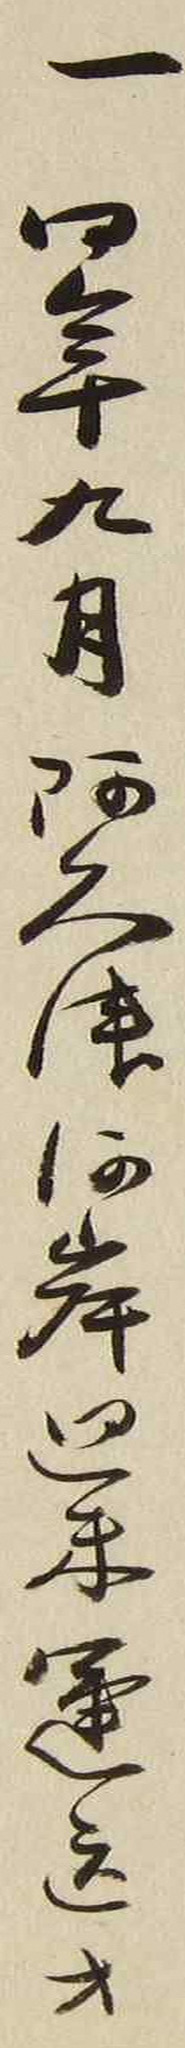一同年九月阿久津河岸廻米運送才
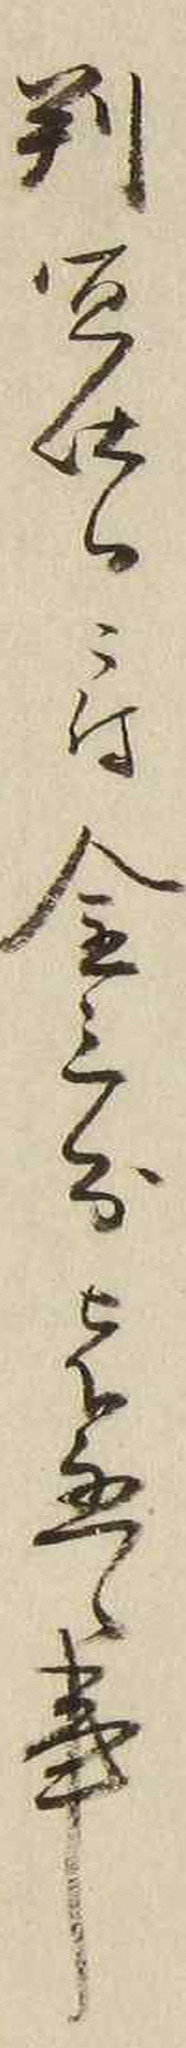判宜仕候ニ付金三分被下置候事

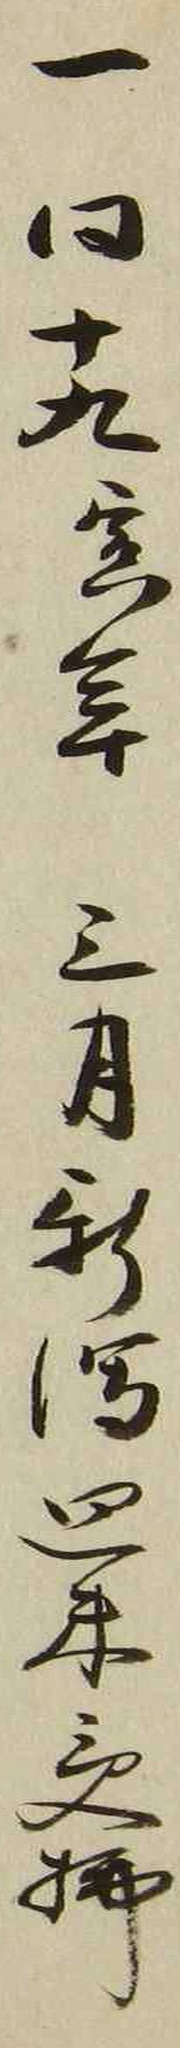一同十九寅年三月新潟廻米受払
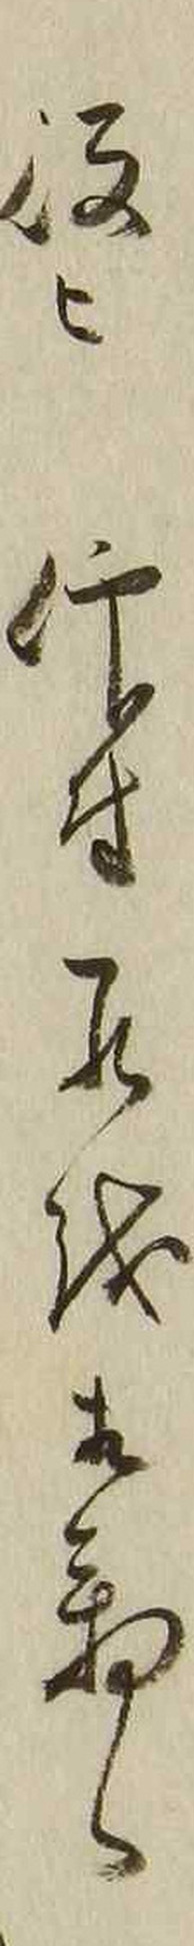役被仰付罷越相勤候
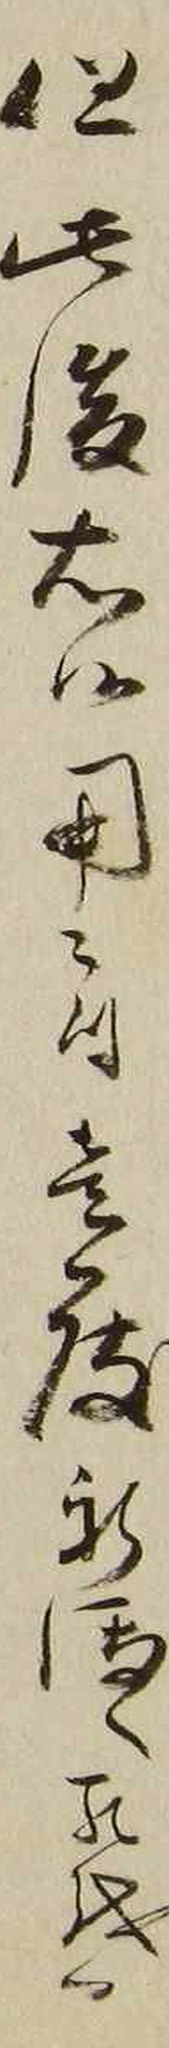但此後右御用ニ付壱度新潟へ罷越候
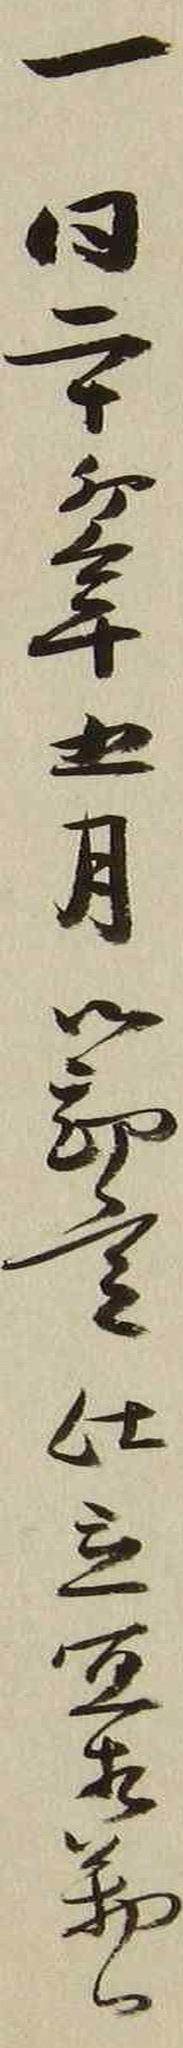一同二十卯年五月御勘定仕立宜相勤候
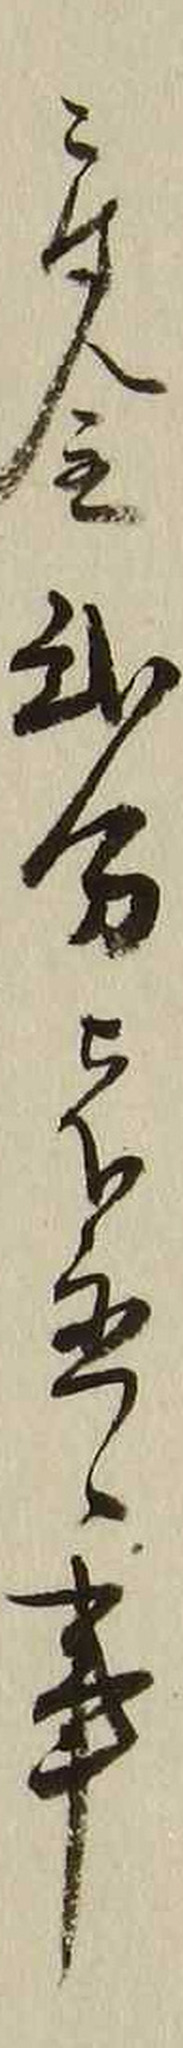ニ付金弐分被下置候事
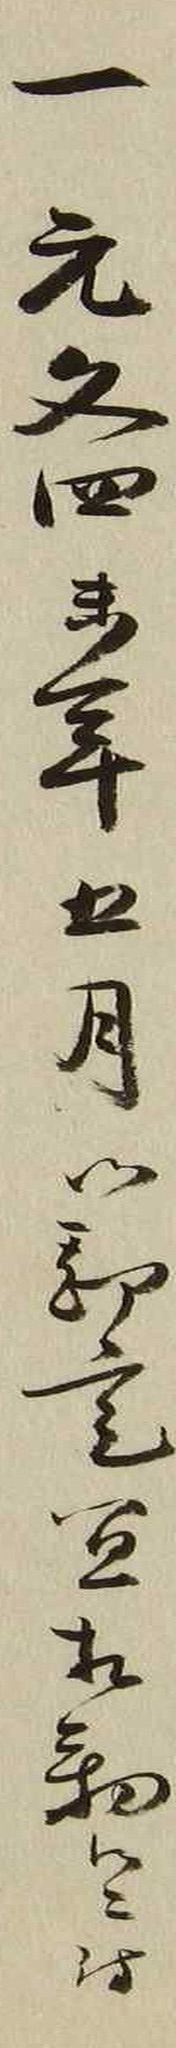一元文四未年五月御勘定宜相勤候ニ付
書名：諸士系譜　巻之288　さ之部20
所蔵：会津若松市立会津図書館
